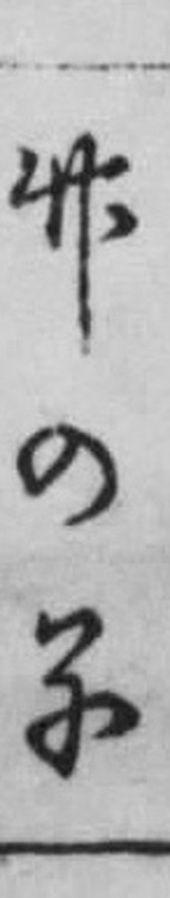竹の子
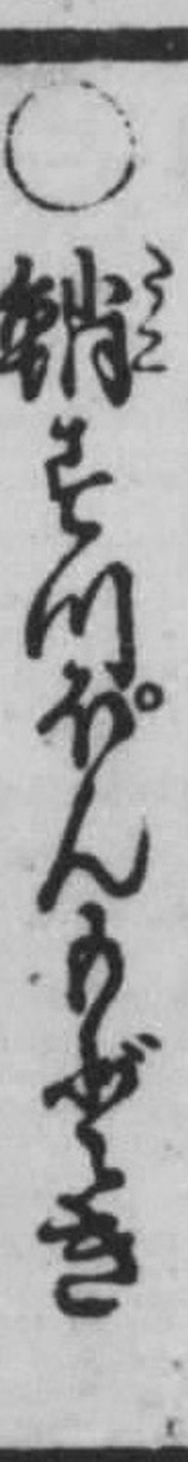〇鮹すつぽんもどき
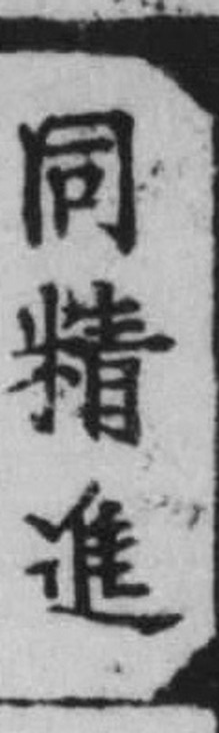同精進
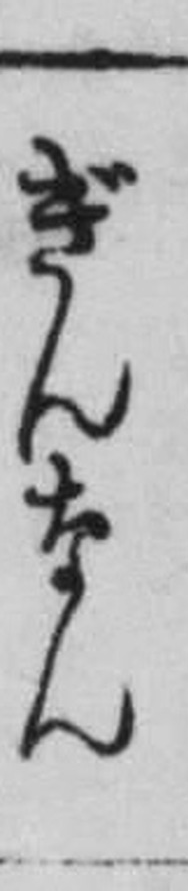ぎんなん
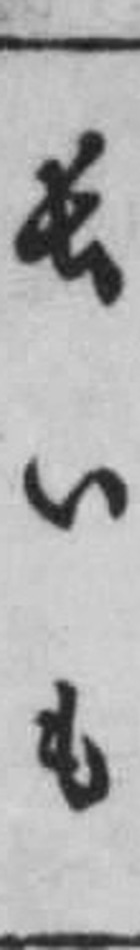長いも
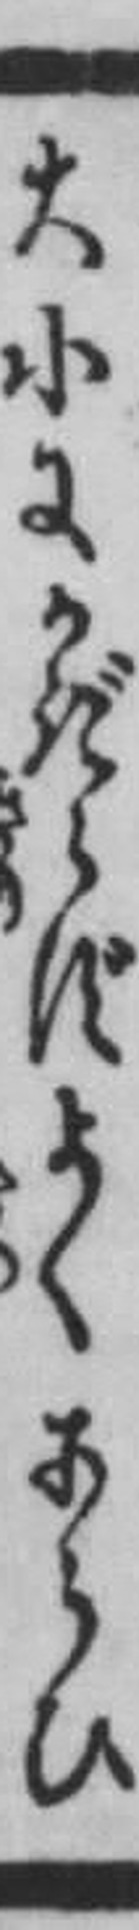大小にかぎらずよくあらひ
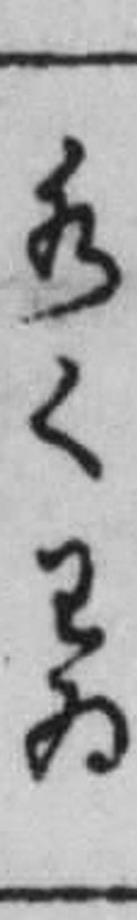小くわゐ
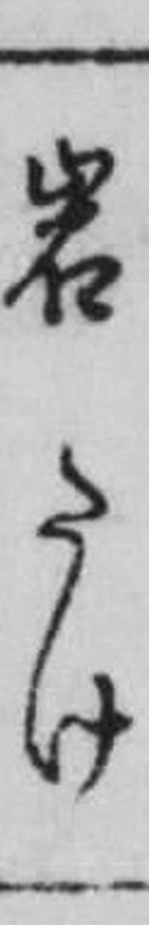岩たけ
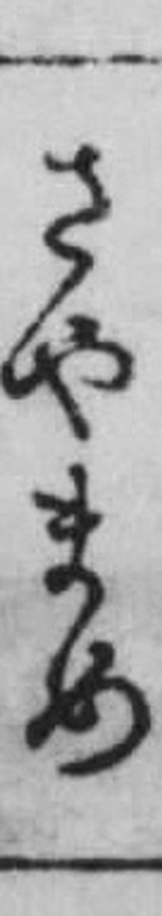さやまめ
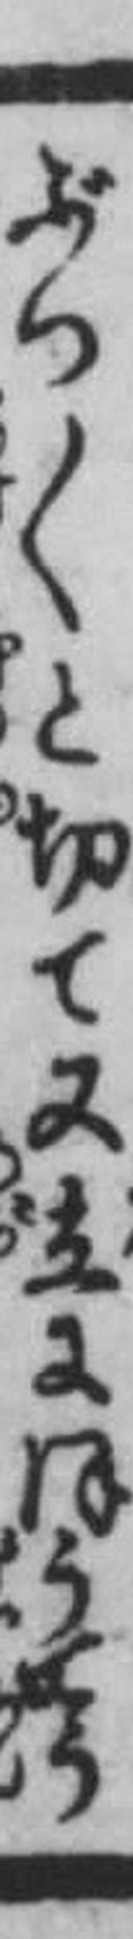ぶつ〳〵と切て又立にほうてう
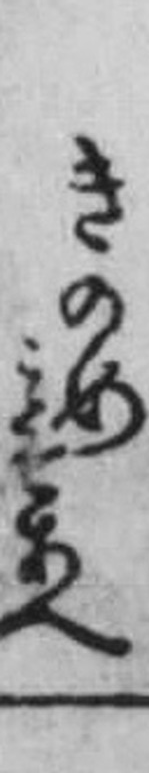きのめみそ
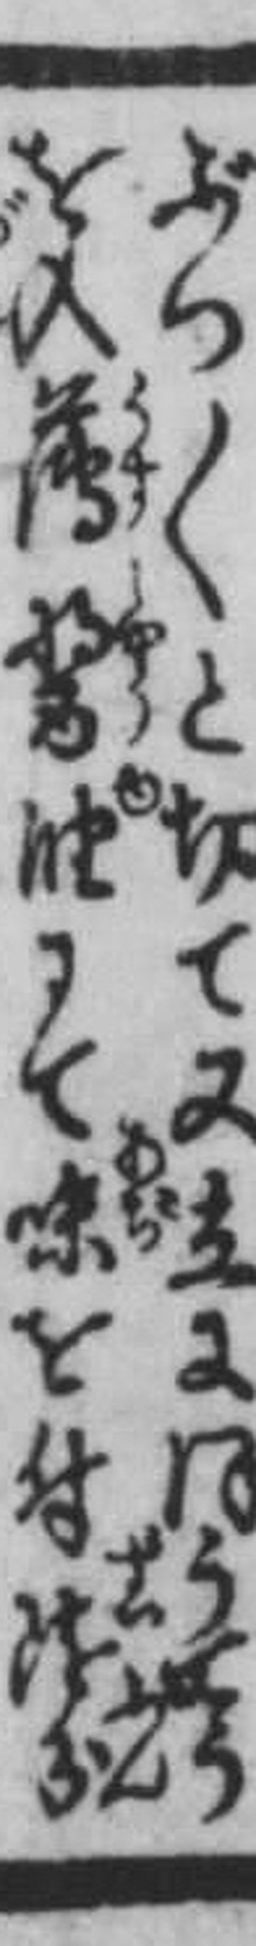を入薄醬油にて味を付随分
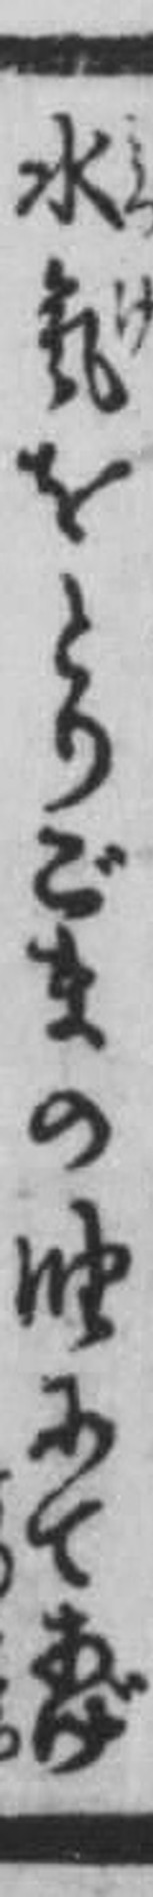水気をとりごまの油にてあげ
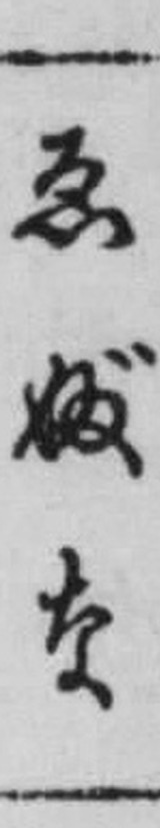ゑぶな
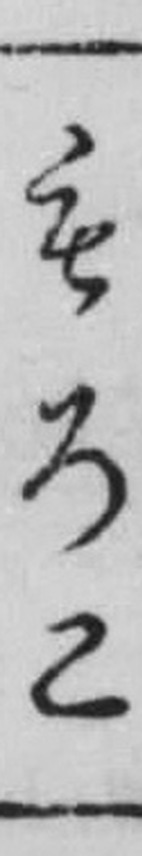もろこ
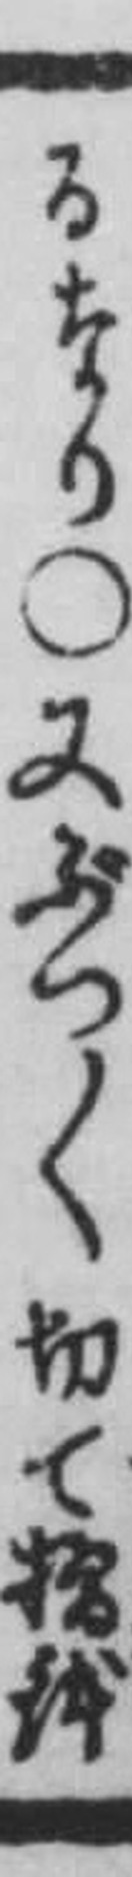るなり〇又ぶつ〳〵切て擂鉢
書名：日用重宝魚類精進/料理早工風
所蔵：大阪府立大学学術情報センター 国文学研究資料館
